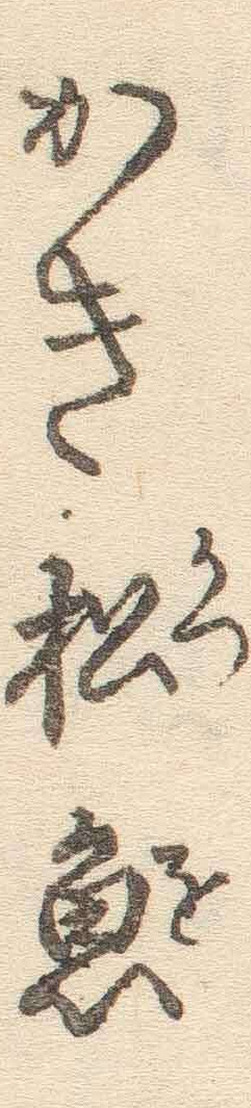かき松魚
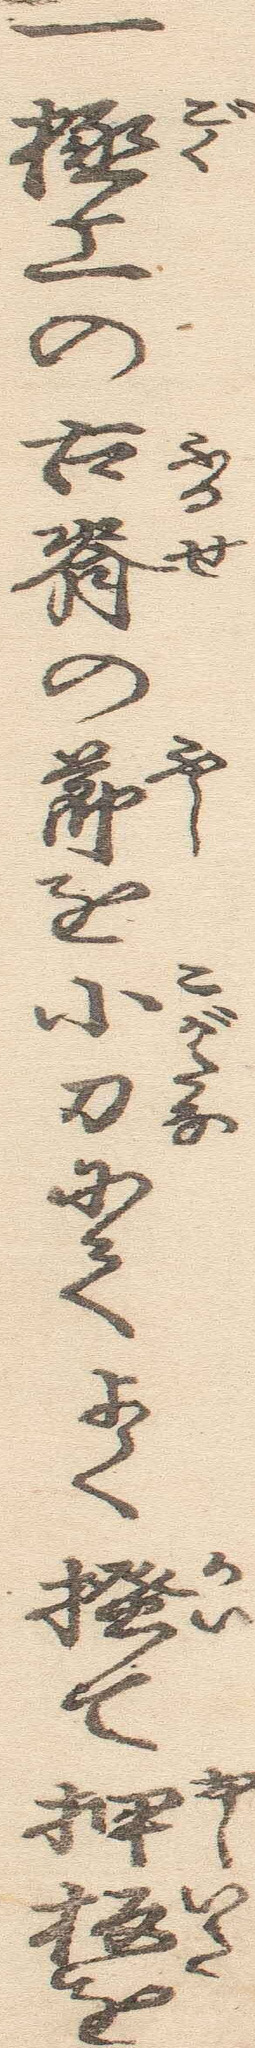一極上の古背の節を小刀にてよく掻て押板を
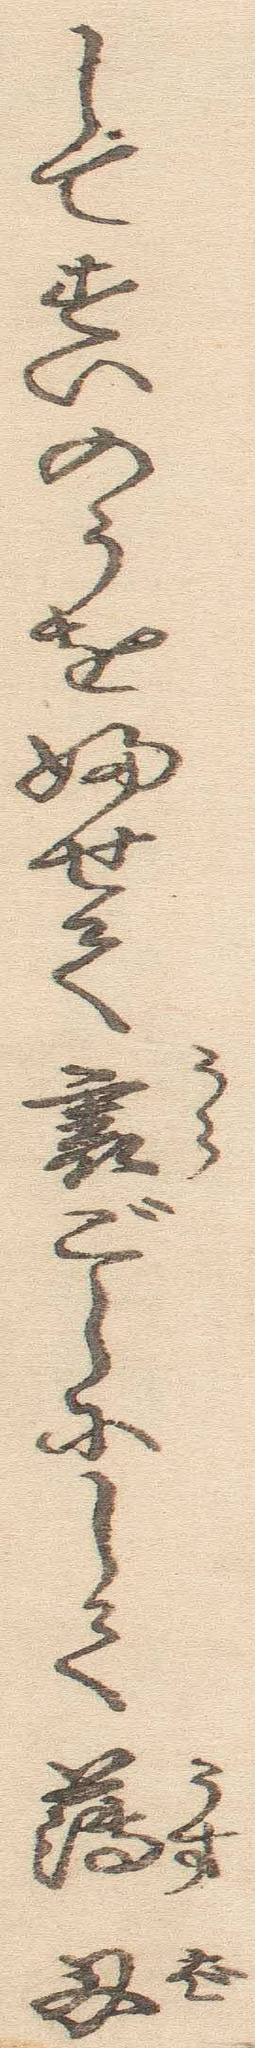してすいのうをふせて裏ごしにして薄刃

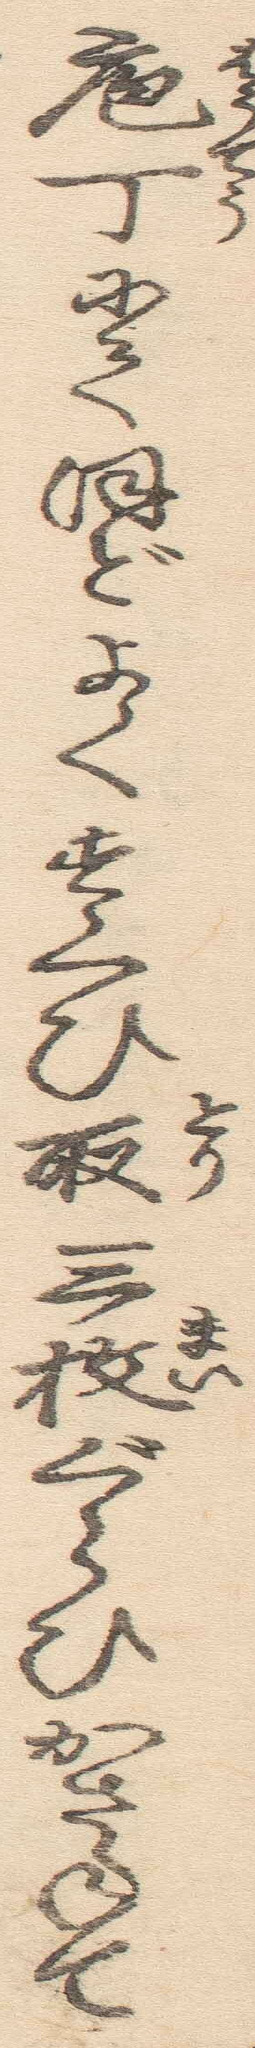庖丁にてほどよくすくひ取三枚ぐらひかさねて
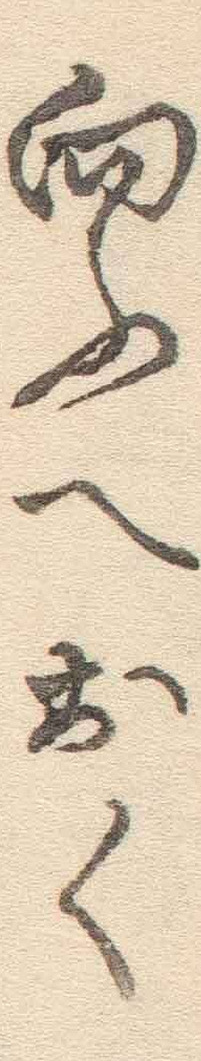向ふへおく
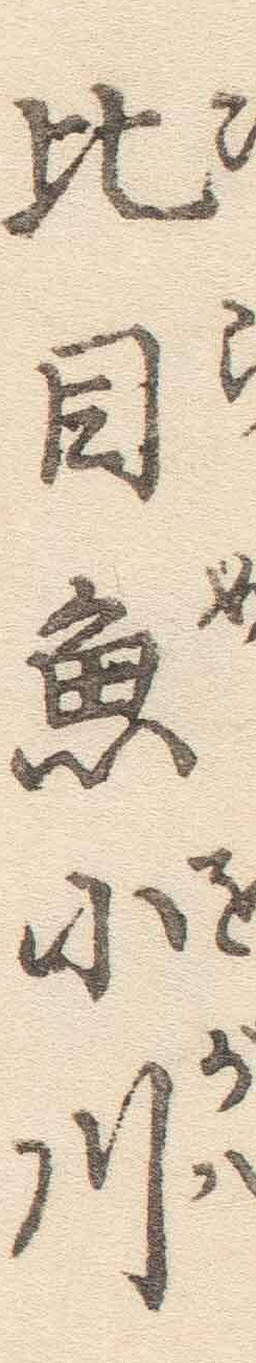比目魚小川
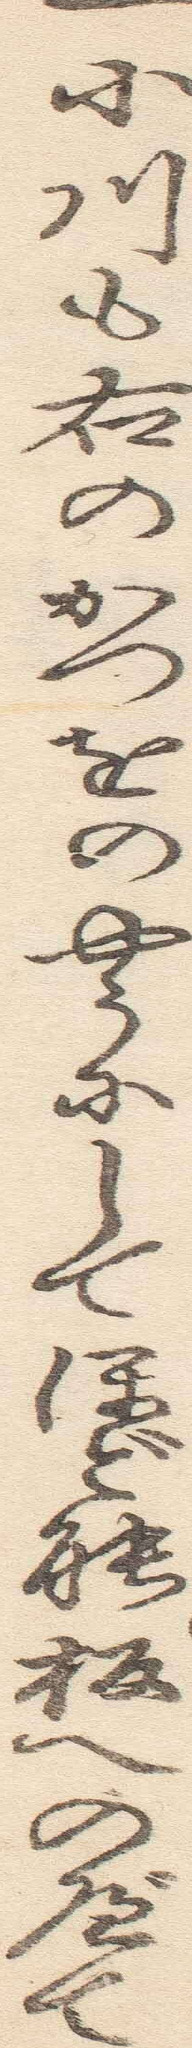一小川も右のかつをのやうにしてほど能板へのべて
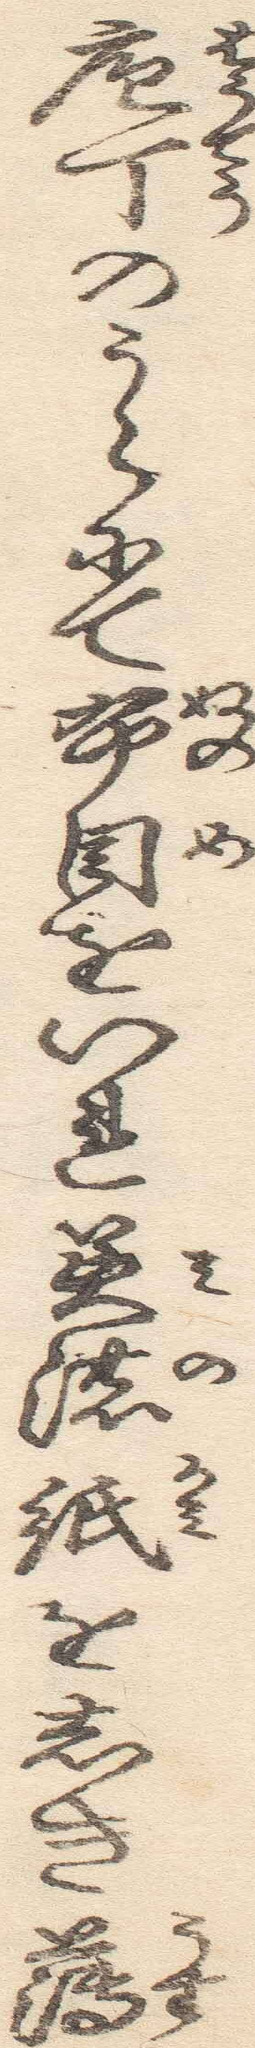庖丁のうらにて布目をいれ美濃紙をしき薄
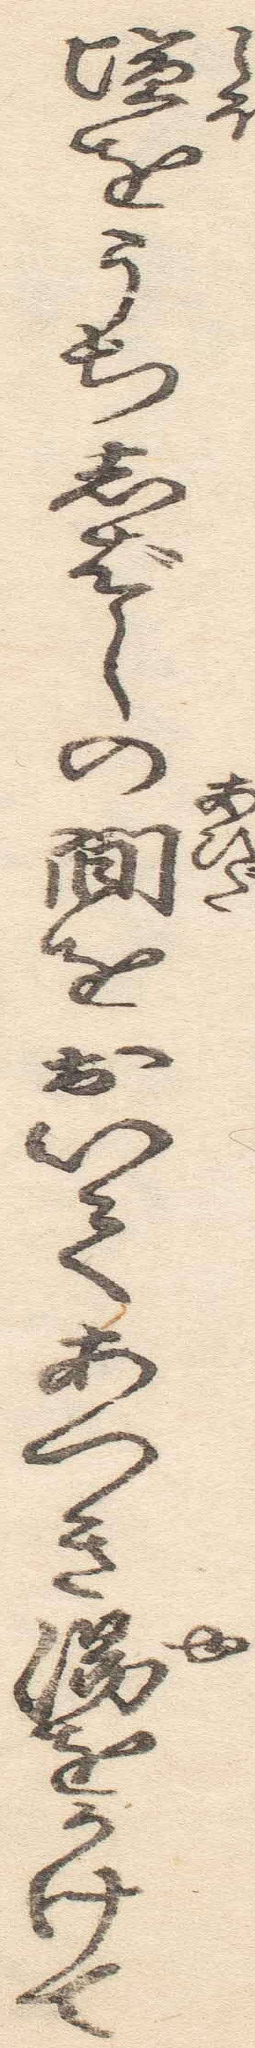塩をうちしばしの間をおいてあつき湯をかけて
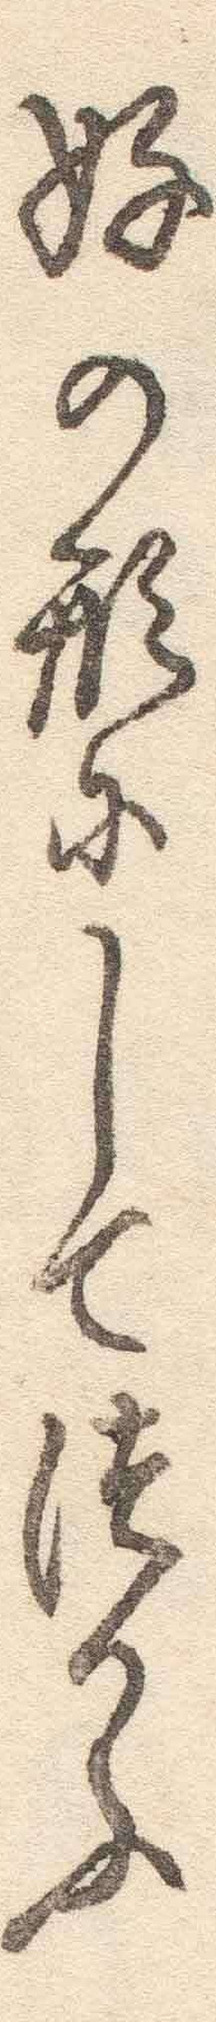好の形にしてつかふ
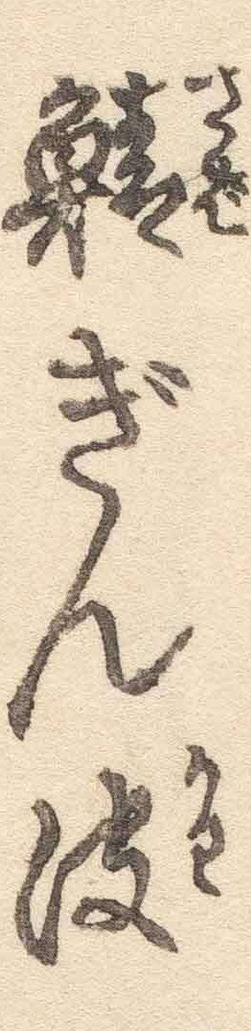鯖ぎん皮
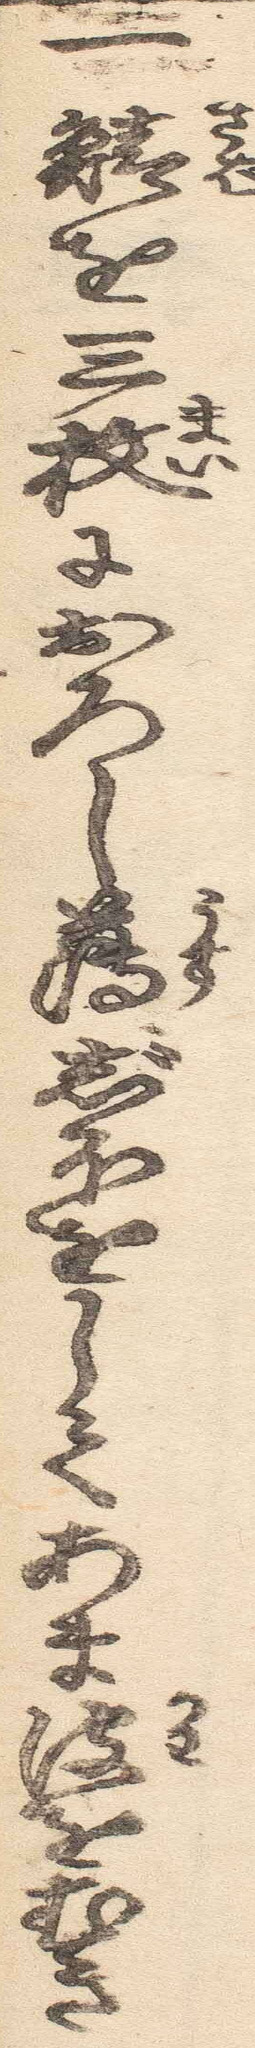一鯖を三枚におろし薄じほをしてあま皮をむき
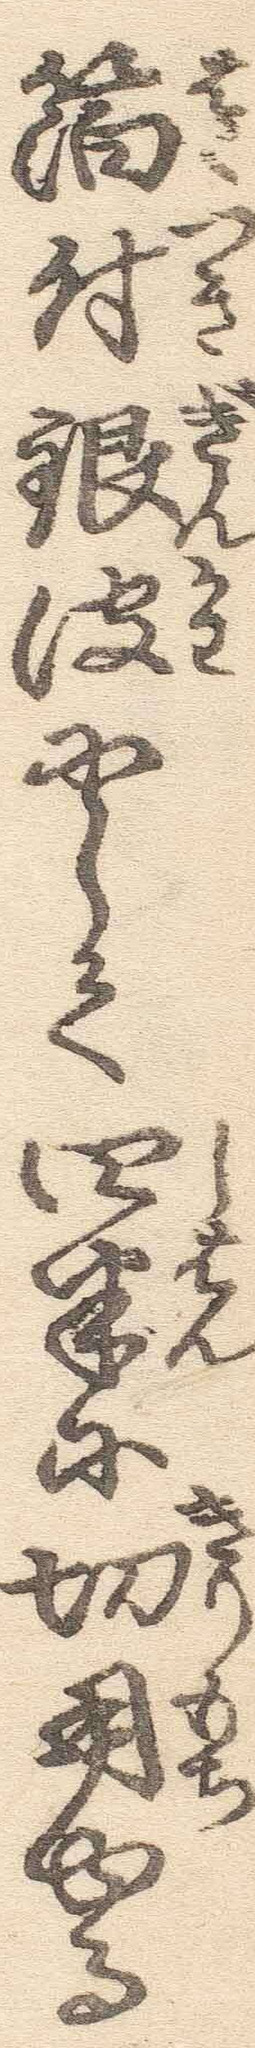箔付銀皮にして四半に切用ゆる
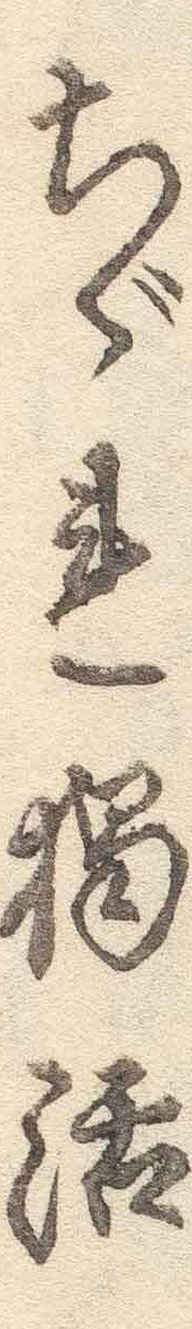ちゞれ独活
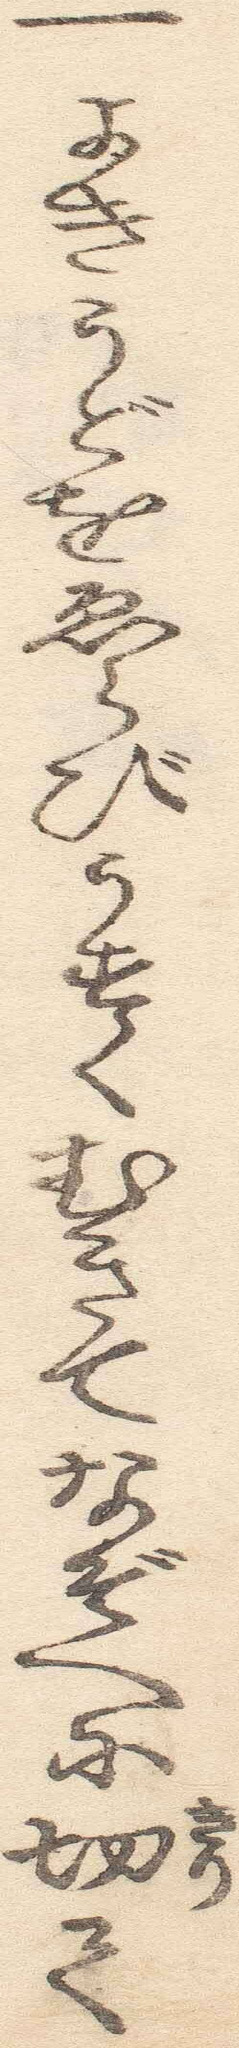一よきうどをゑらびうすくむきてなぞへに切て
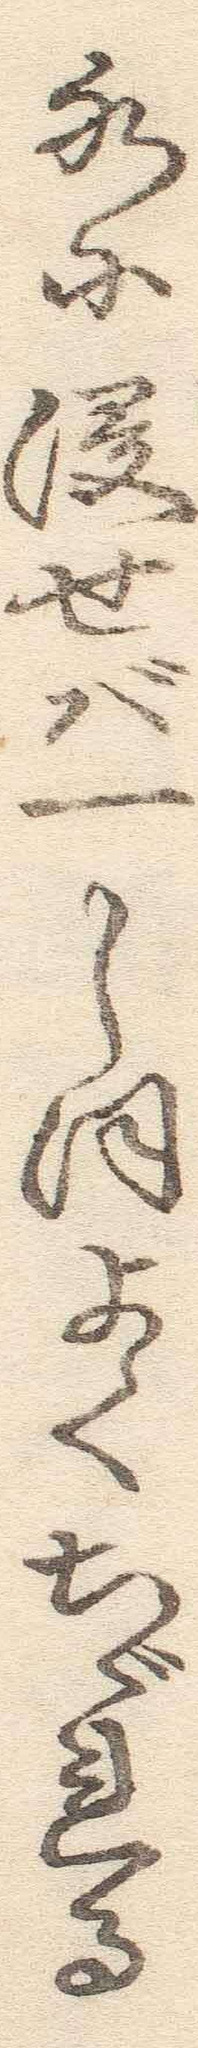水に浸せば一しほよくちゞれる
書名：料理通
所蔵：東京学芸大学附属図書館 国文学研究資料館
